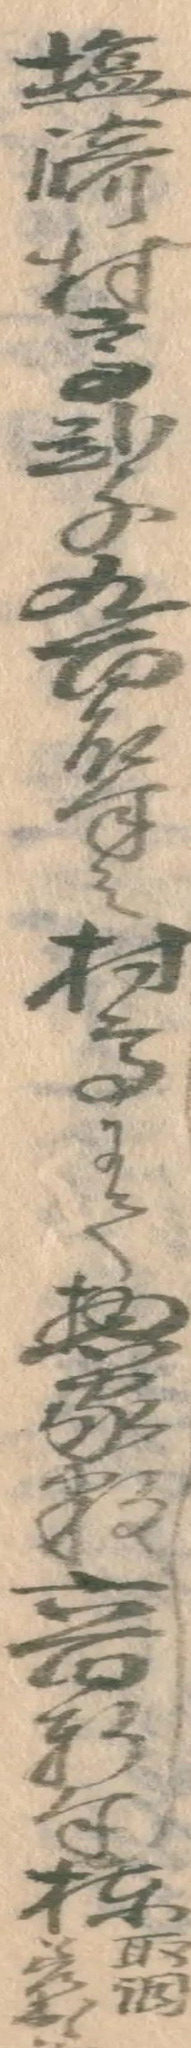塩崎村高弐千九百石余之村方にて惣家数六百軒余棟
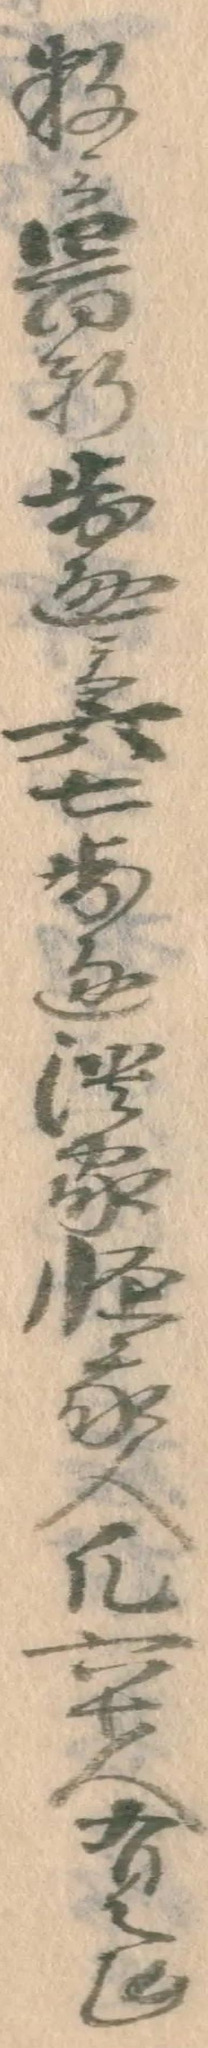数二而四百軒歩通二而六七歩通潰家怪我人凡六十人有之趣
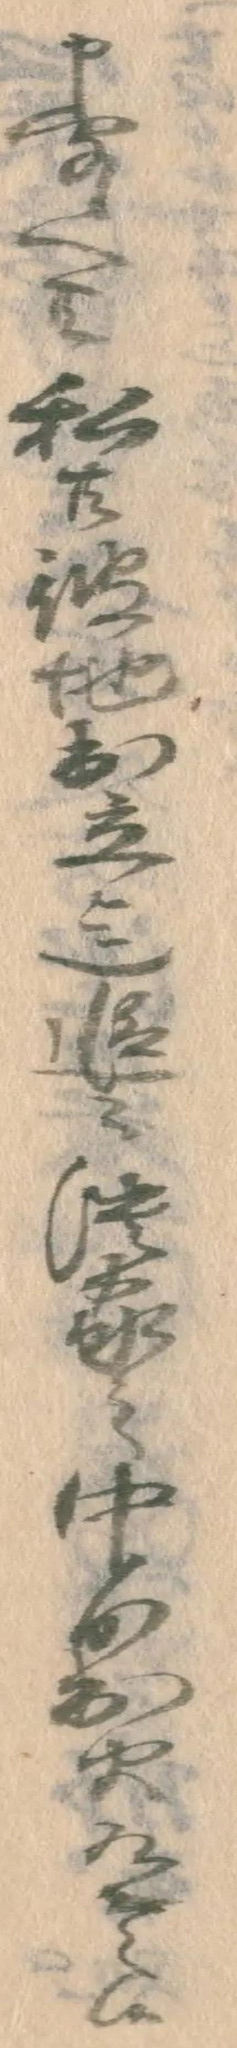申聞候へ共私共彼地出立迄追々潰家之中ゟ出火有之候
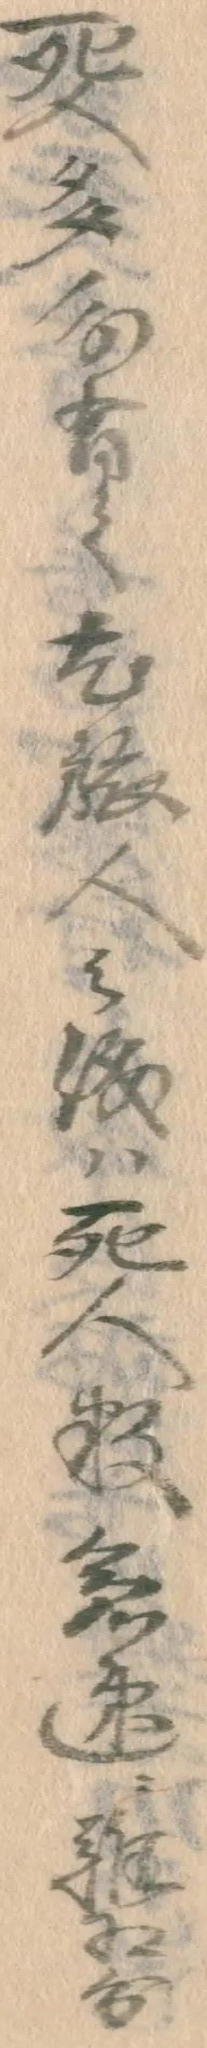死人多分有之尤旅人之儀ハ死人数急速二難相分
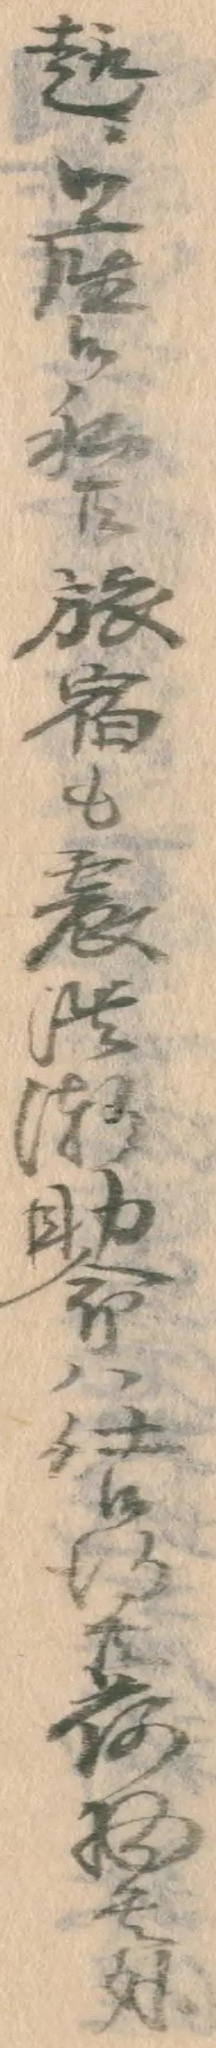趣二候趣ニ御座候私共旅宿も震潰漸助命ハ仕候得共荷物外
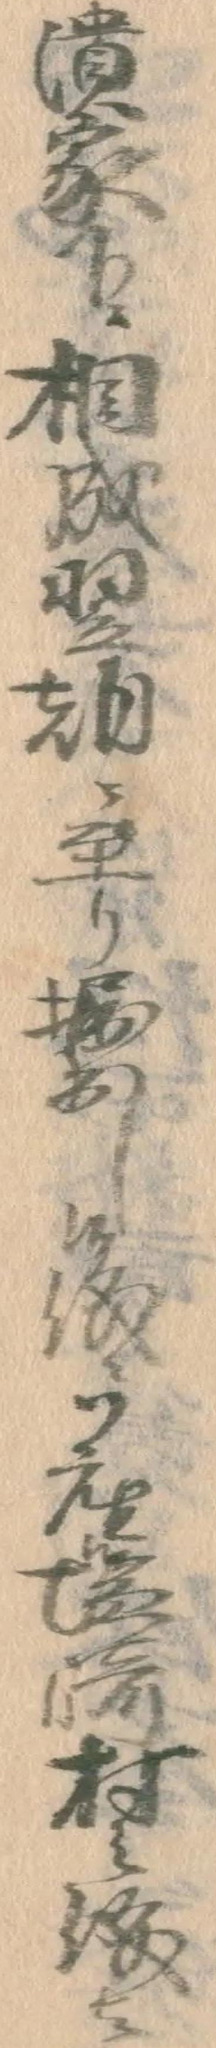潰家下ニ相成翌朝ニ至り掘出し候儀ニ御座候塩崎村之儀者
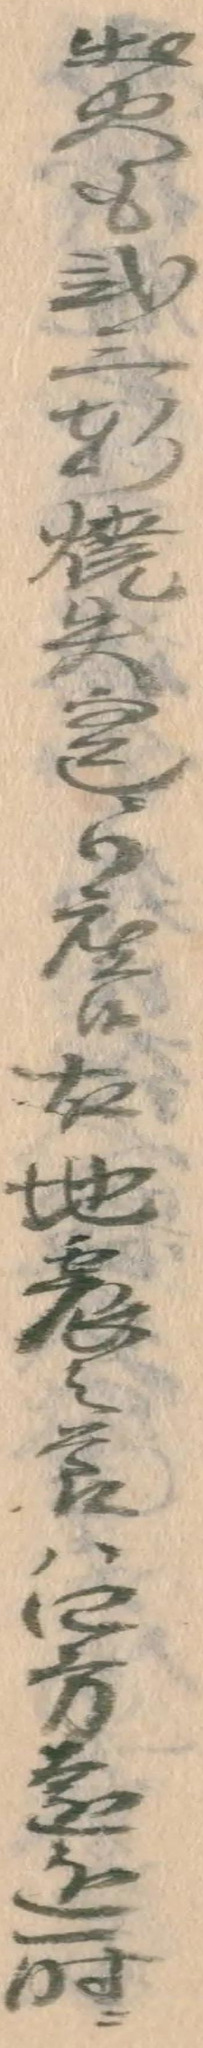出火も弐三軒焼失而巳二御座候右地震之節は四方遠近一時二
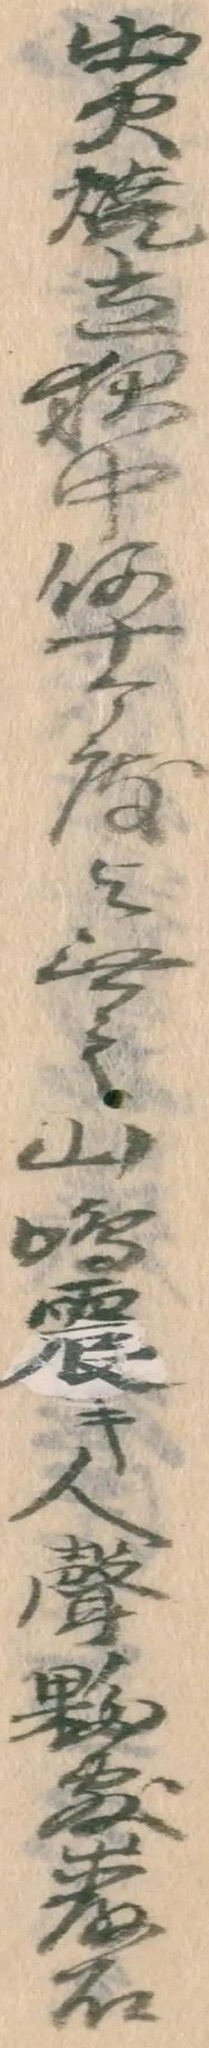出火焼立夜中何十ヶ度と無之山鳴震キ人声夥敷岩石
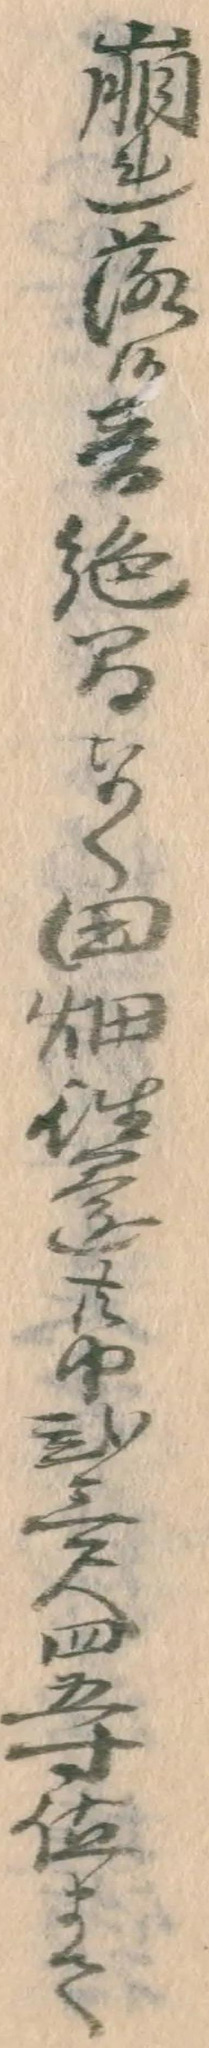崩れ落候音絶間なく田畑往還共巾弐三尺四五寸位まて
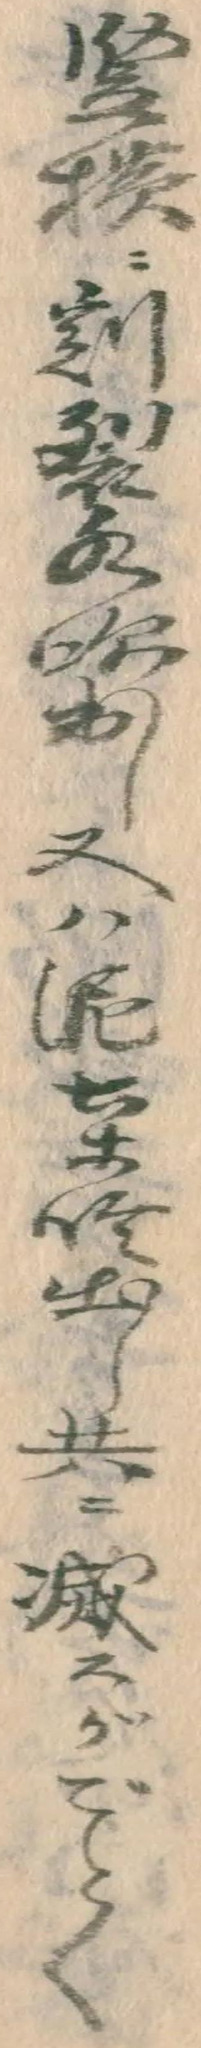竪横ニ割裂水吹出し又ハ泥土等吹出し共二滅スがごとく
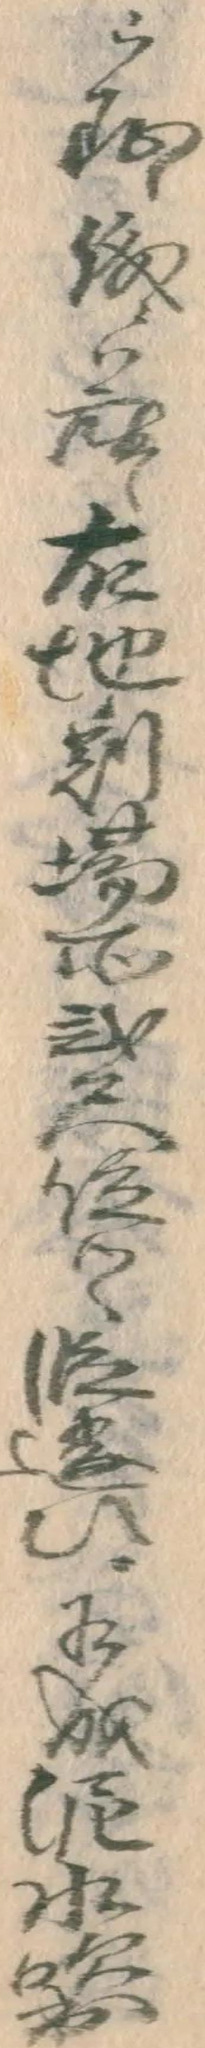被存候儀ニ御座候右地割場所所々弐尺位ツゝ段違ひニ相成泥水吹出
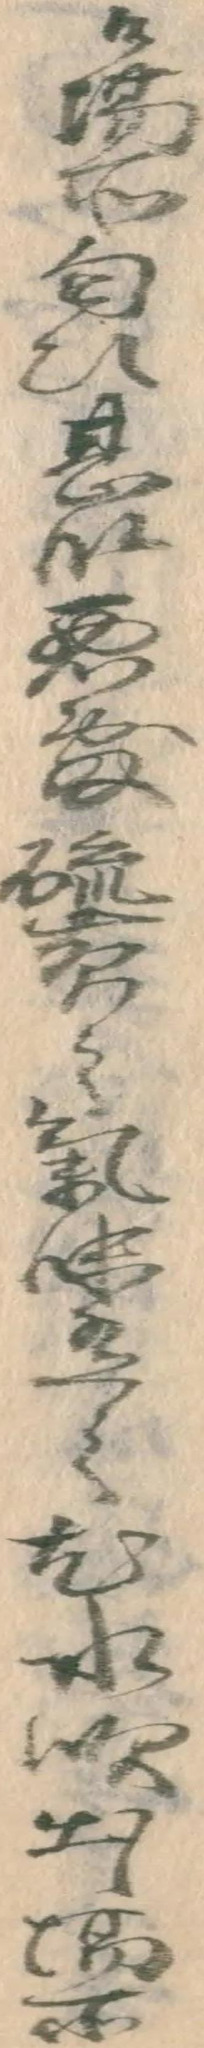候場所匂ひ甚以悪敷硫黄之気味有尤水吹出候場所
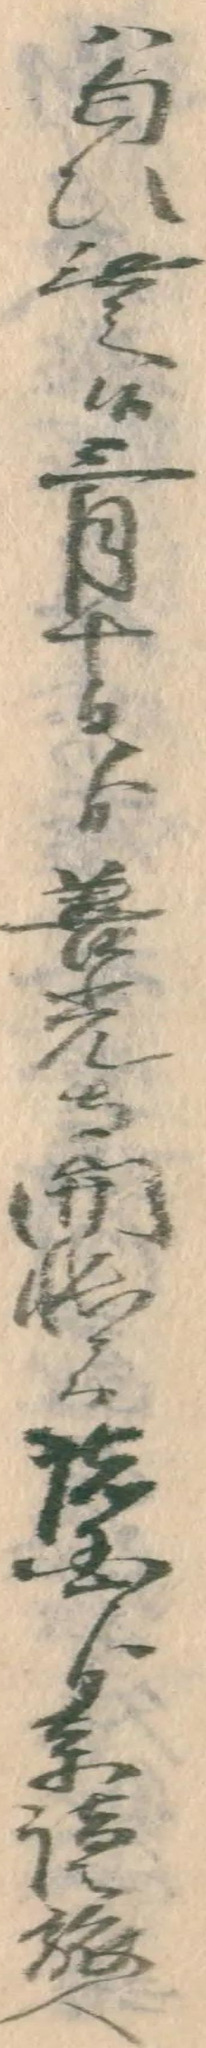ハ匂ひ無之候三月十日ゟ善光寺開帳ニ而諸国ゟ参詣之旅人
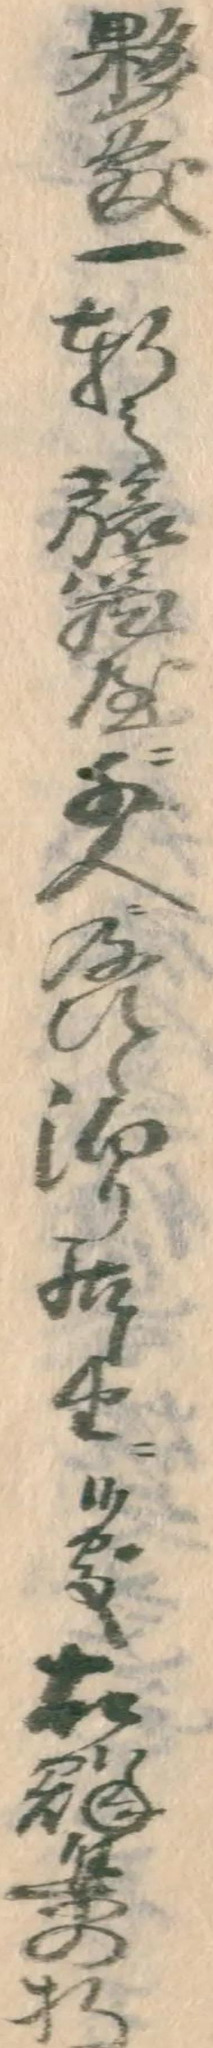夥敷一軒之旅籠屋ニ千人二及び候泊り居候由二候処右群集の折
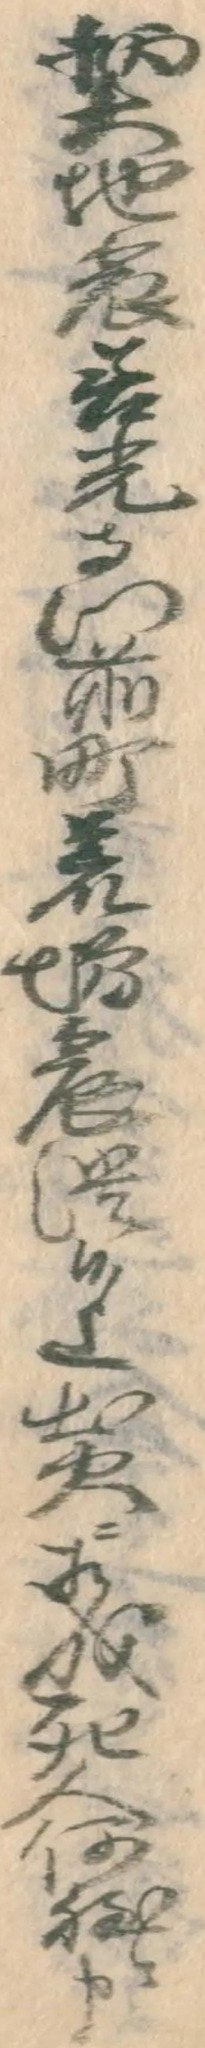柄大地震善光寺門前町荒増震潰候上出火二相成死人何程と申

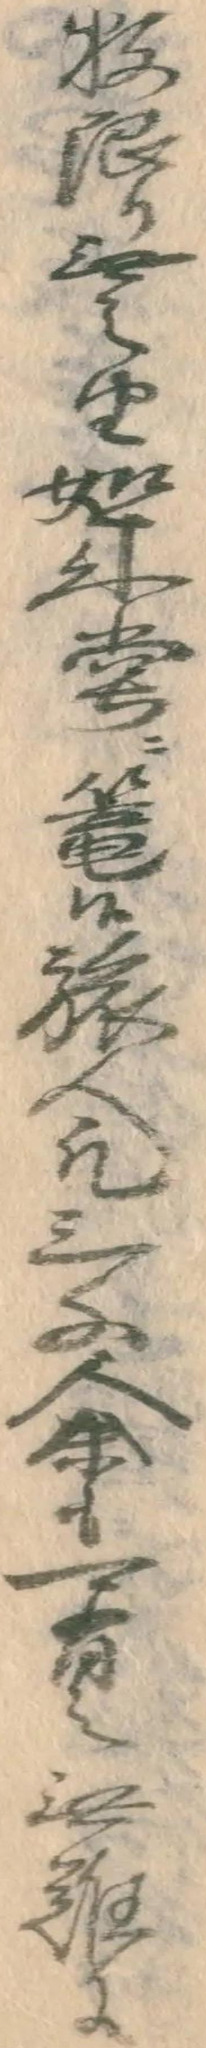数限り無之由如来堂ニ篭候旅人凡三十人余も可有之無難に
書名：信州大地震之記
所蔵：国立国会図書館 National Diet Library, JAPAN
